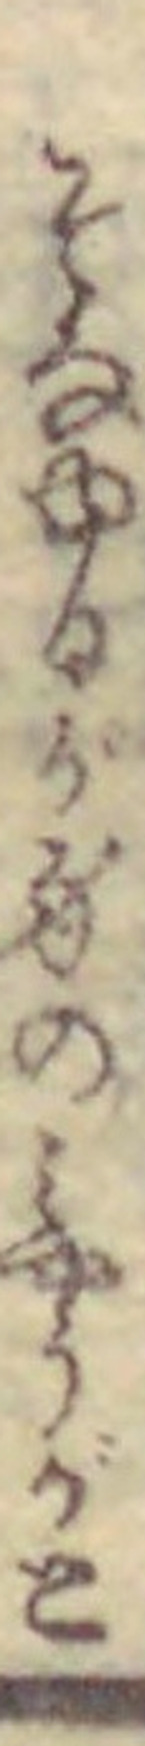そなゆるが身のみやうがと
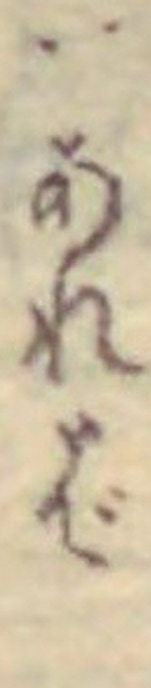あれば
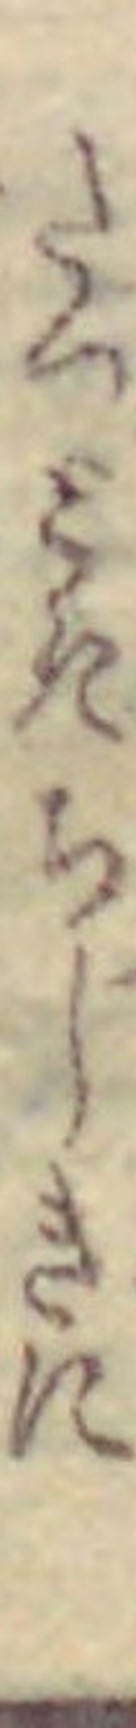たつときちしきに
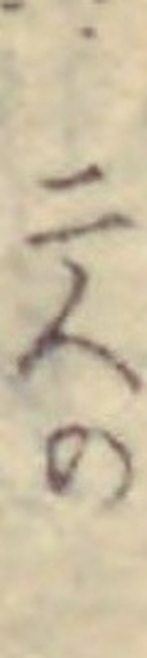二人の
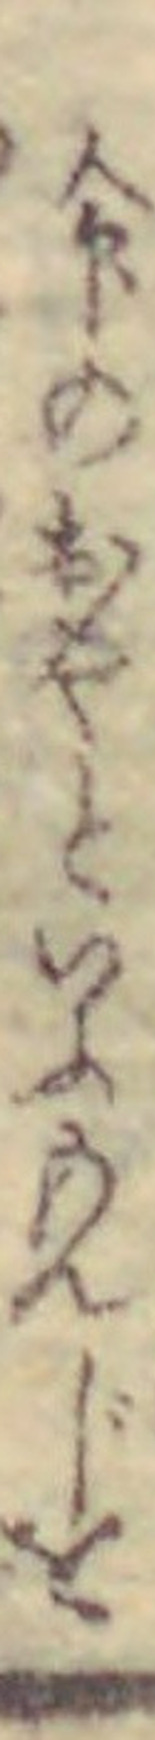命のおやといふもんじを
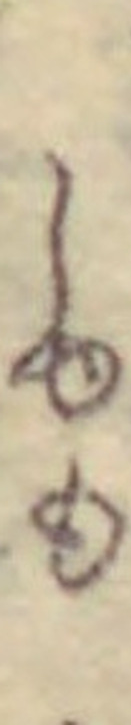しゆも
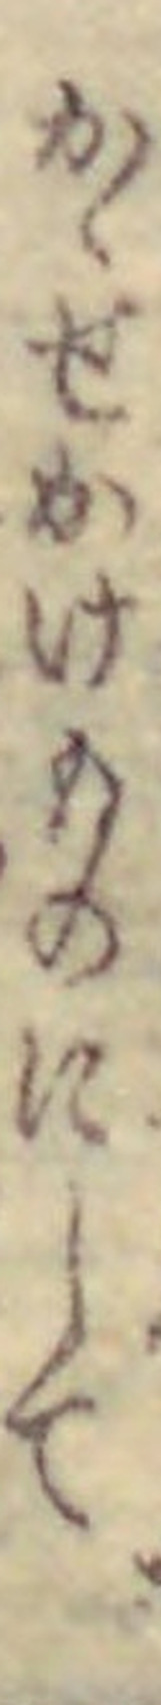かゝせかけものにして
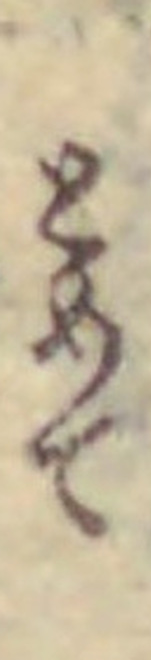とめて
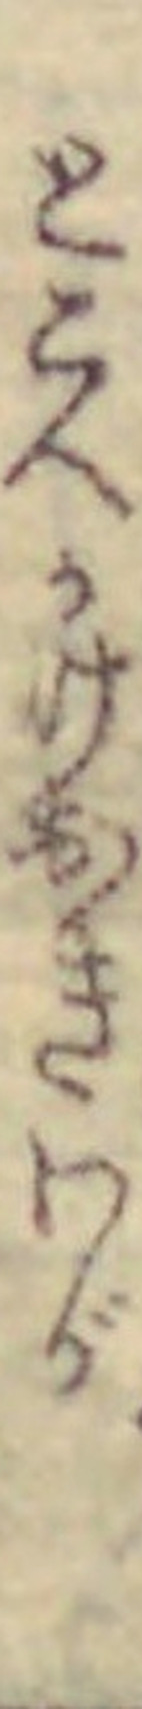とこへかけおきわが
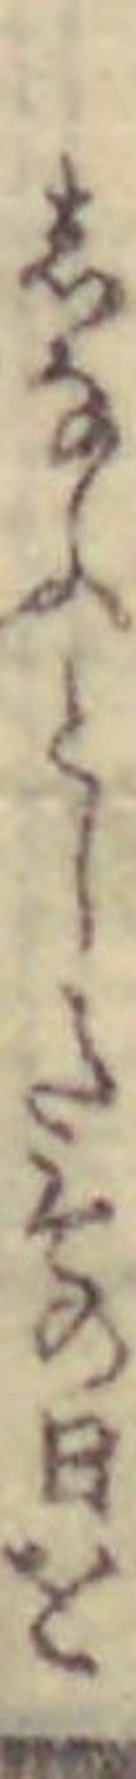しなふとしたその日を
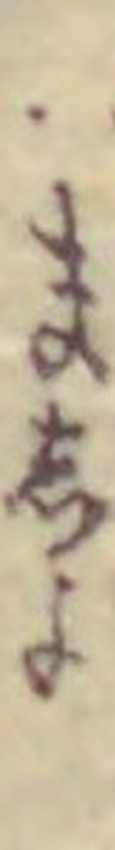ましよ
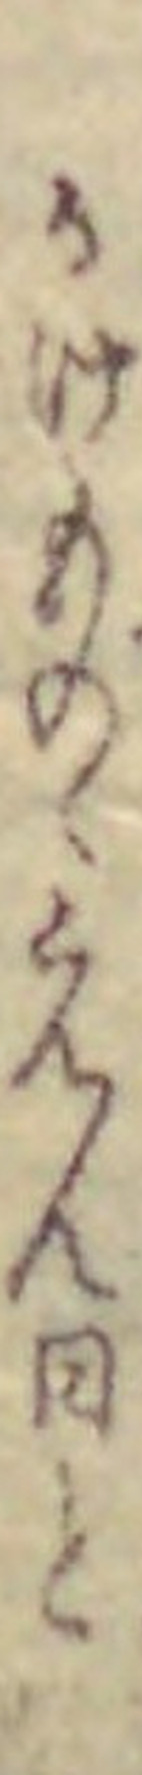かけものゝえん日と
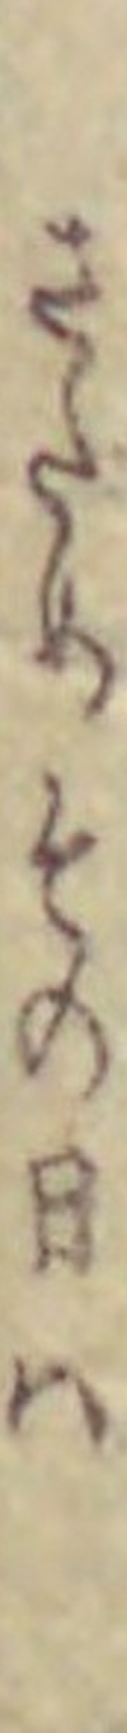さだめその日は
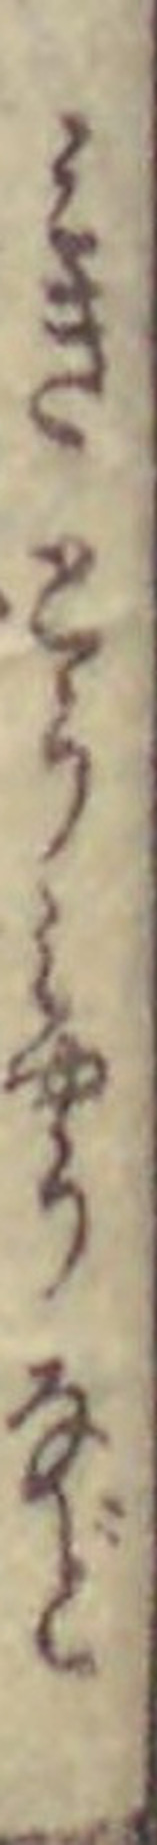みきとうみやうなど
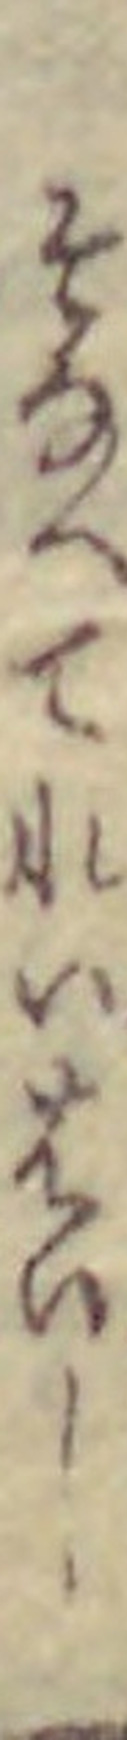そなへてれいはいし
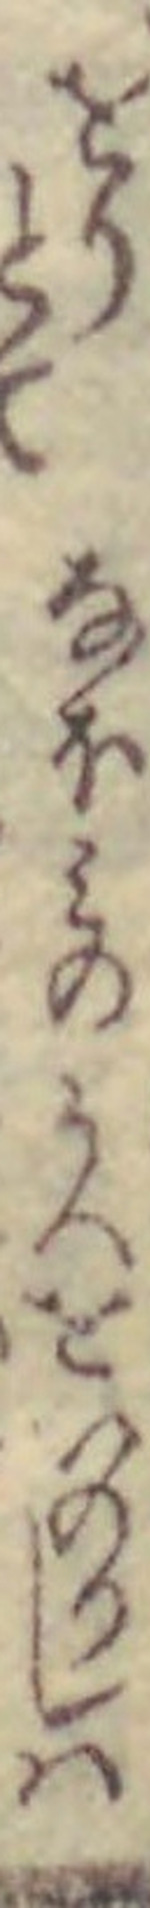なほみのうへをいのりしは
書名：八ツ目鱣因縁物語 3巻
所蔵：国立国会図書館 National Diet Library, JAPAN
